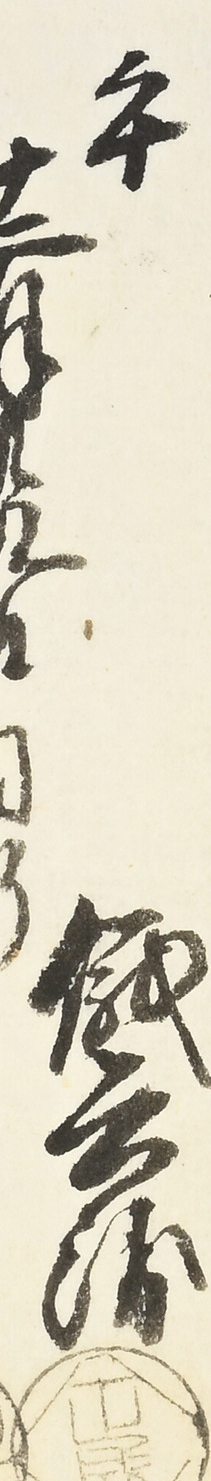午十二月廿九日
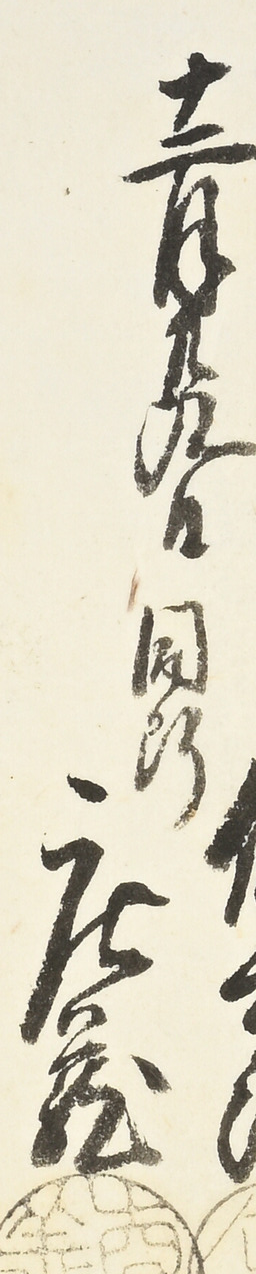午十二月廿九日同断
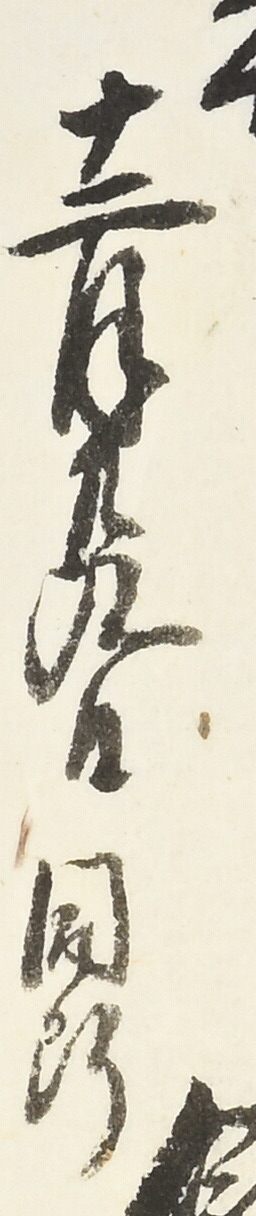午十二月廿九日同断
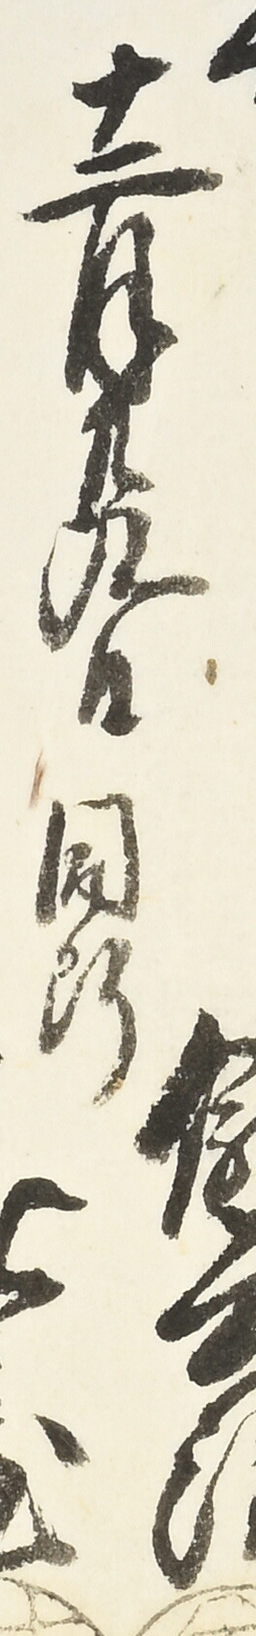午十二月廿九日同断
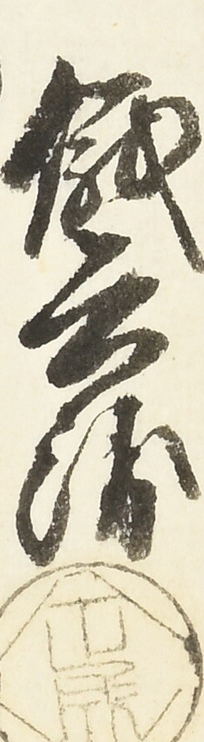儀兵衛
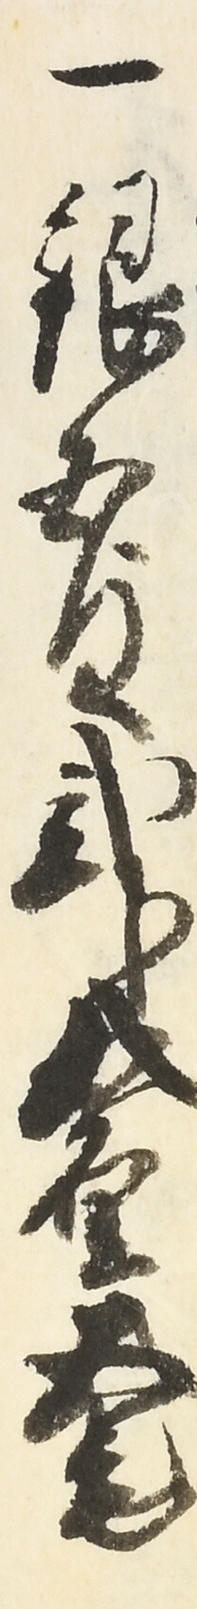一銀壱匁五分六厘五毛

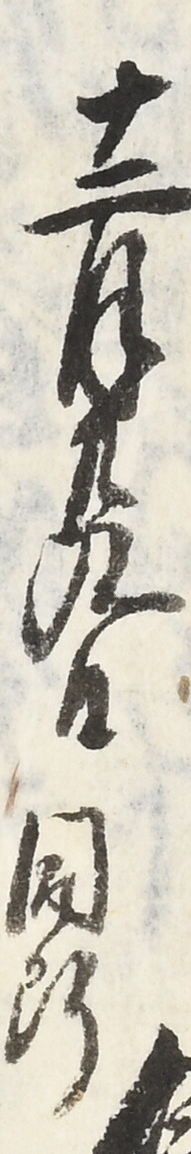午十二月廿九日同断
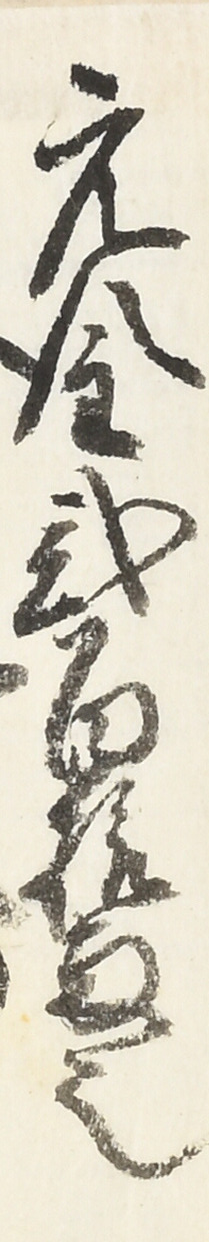元金弐百拾両也
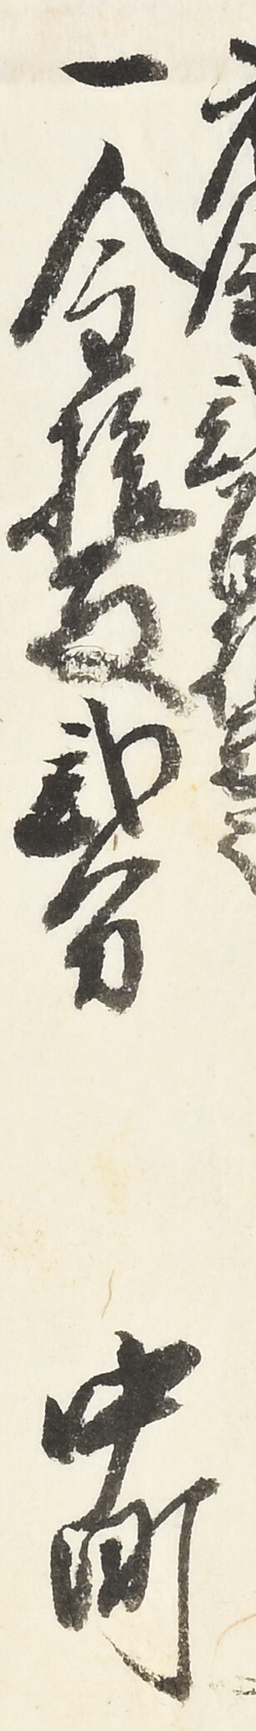一金拾両弐分中町
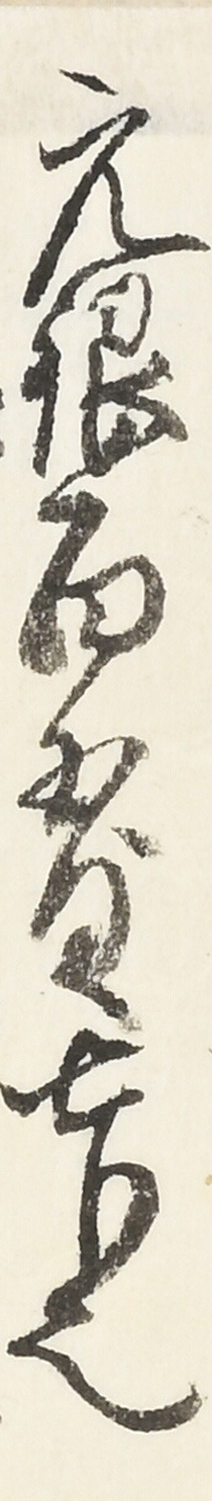元銀百五匁七分也
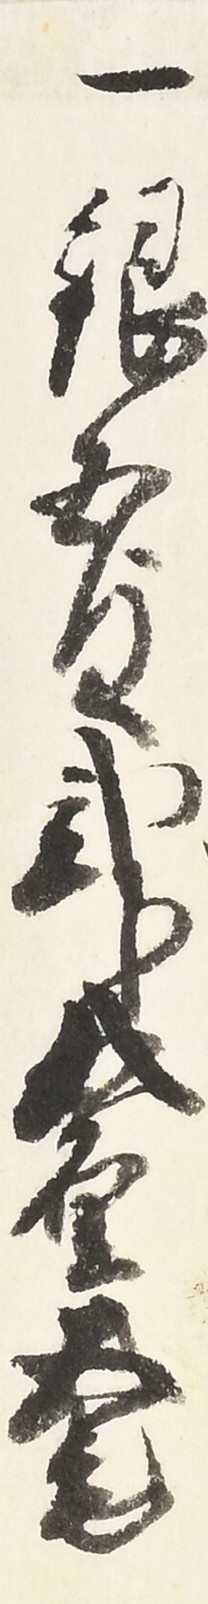一銀五匁弐分八厘五毛
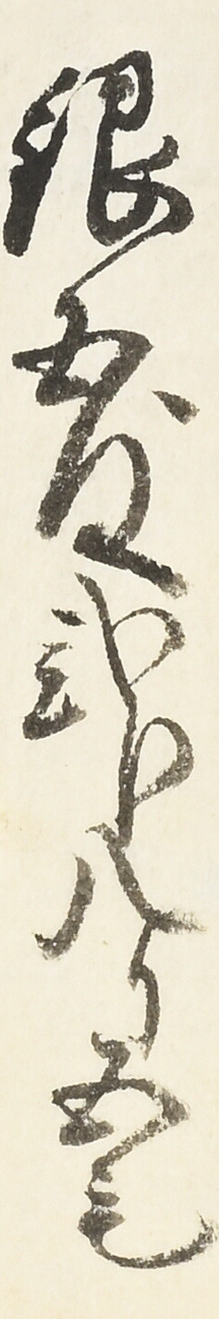銀五匁弐分八厘五毛
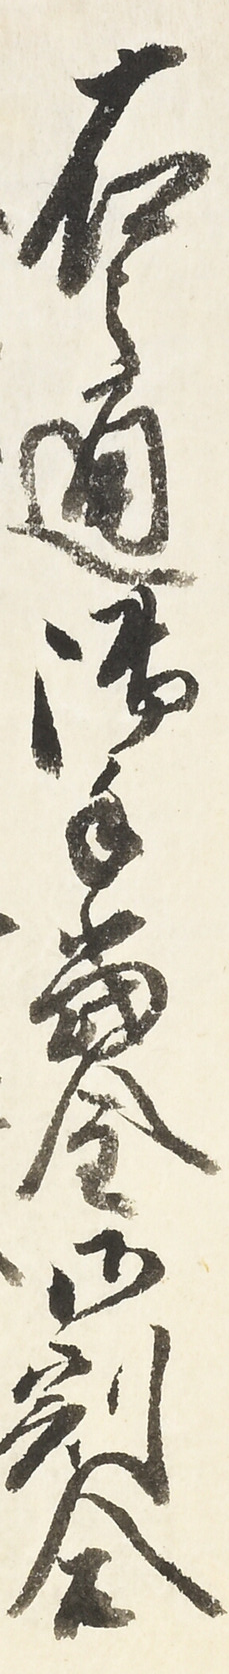右之通御手当金御割合
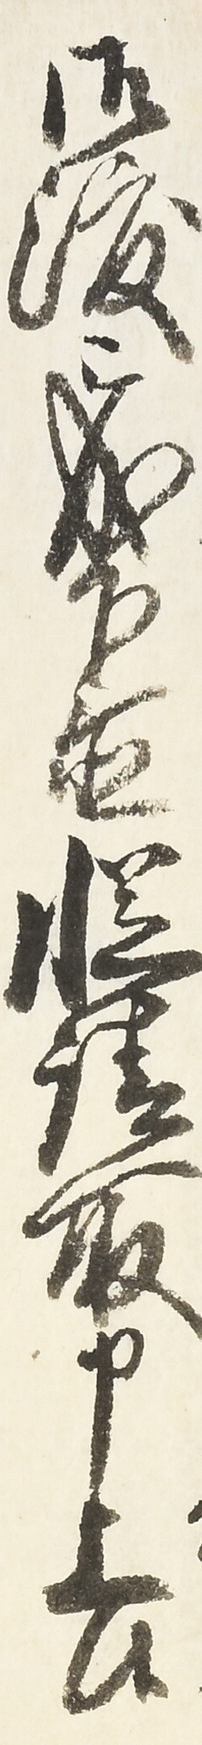御渡被成下置慥請取申上候
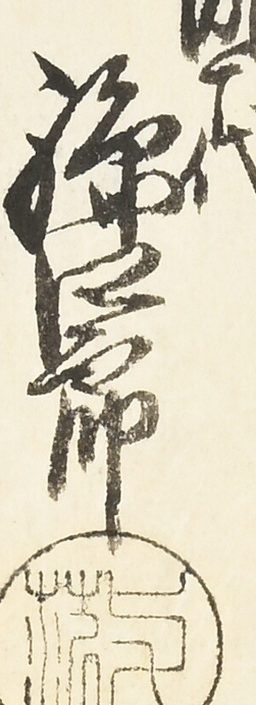孫四郎
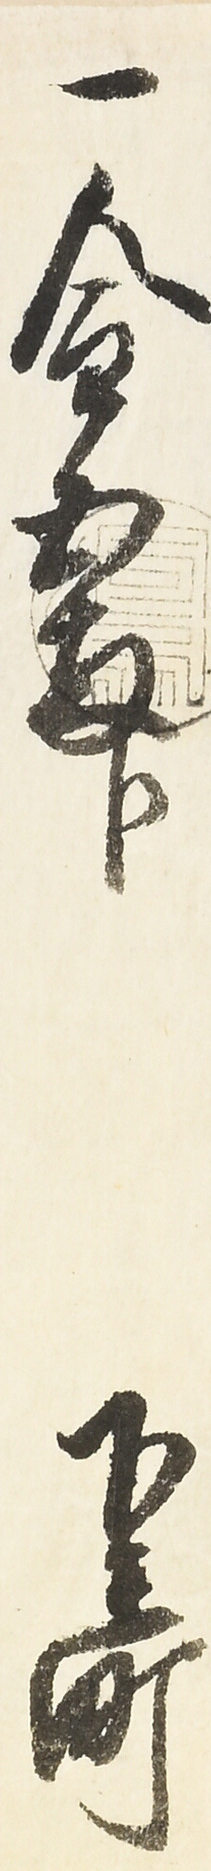一金五両ト下モ町
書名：御才覚金御利足割渡扣帳
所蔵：伊那市立高遠町図書館・合同会社AMANE
